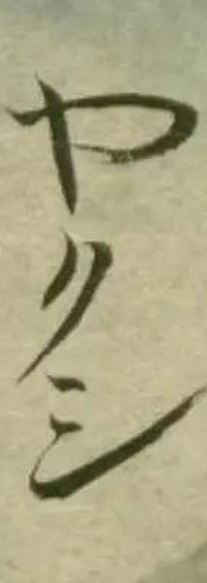ヤクシ
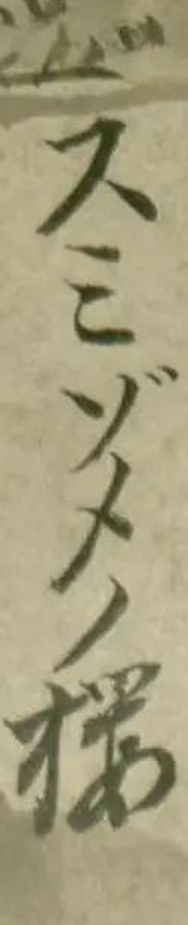スミゾメノ桜
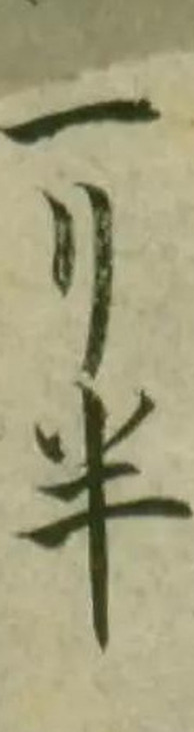一リ半
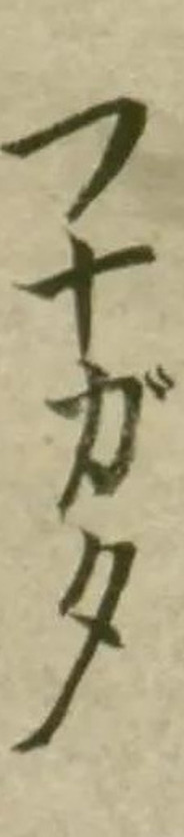フナガタ

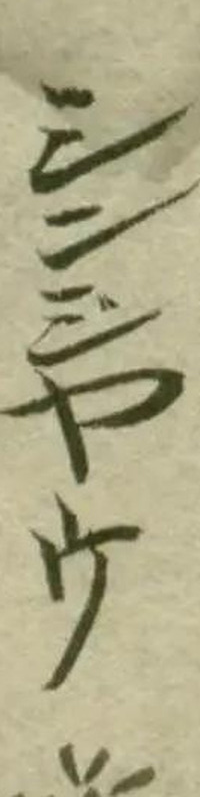シンジヤウ

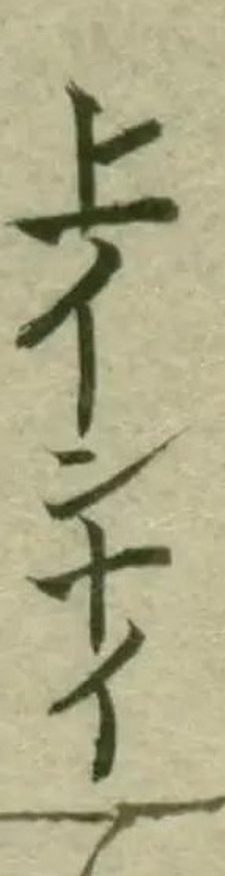上インナイ
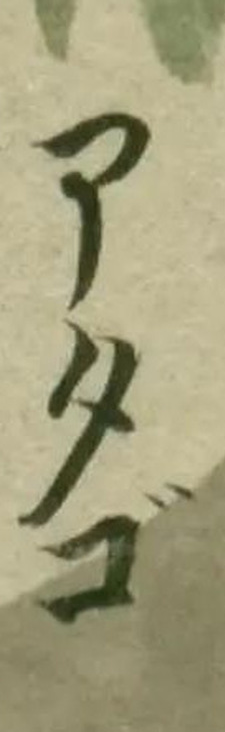アタゴ
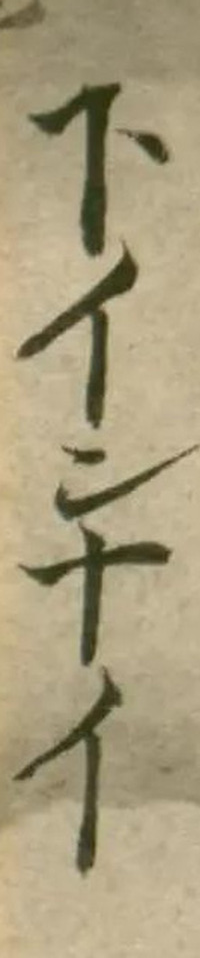下インナイ

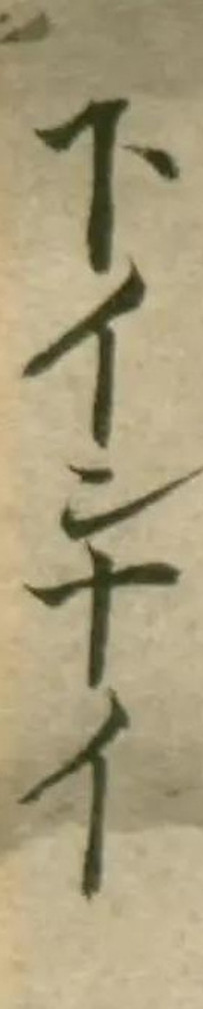下インナイ
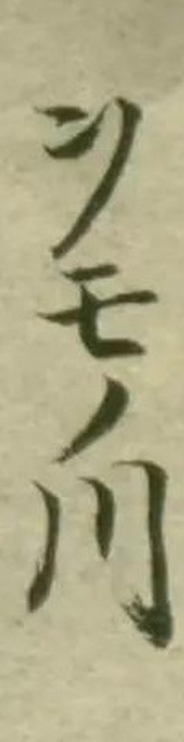ヲモノ川
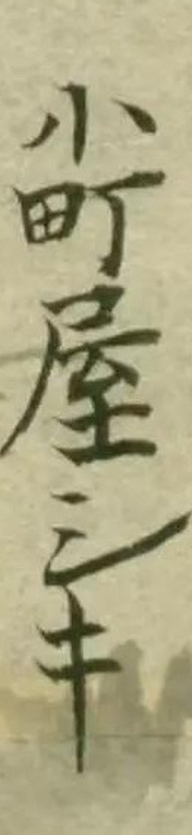小町屋シキ
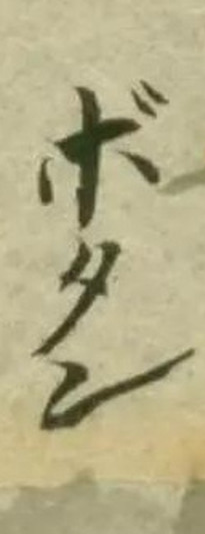ボタン
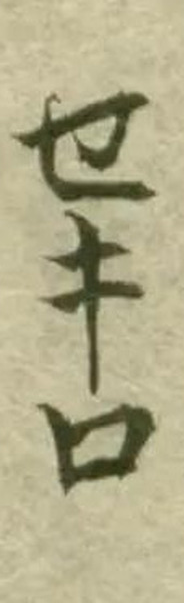セキ口
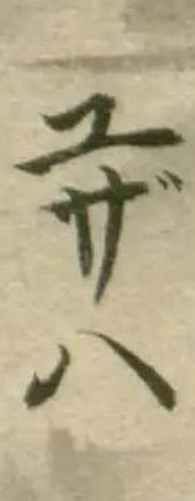ユザハ
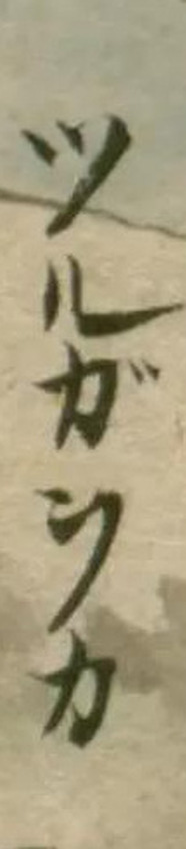ツルガヲカ

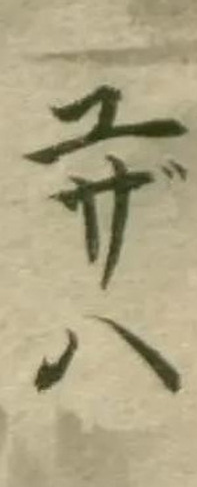ユザハ
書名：江戸より奥州津輕迄道筋之圖
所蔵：国立国会図書館 National Diet Library, JAPAN
